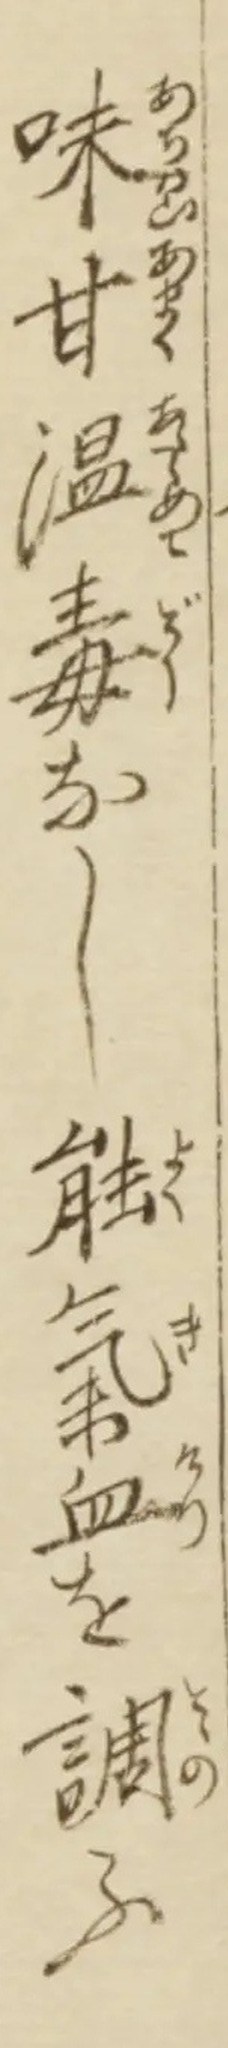味甘温毒なし能気血を調ふ
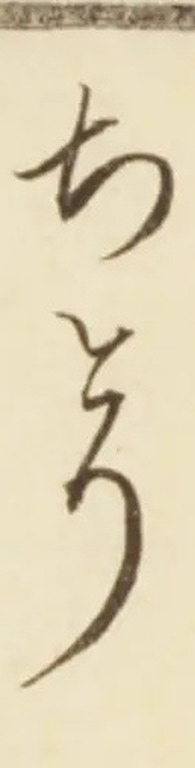ちとり

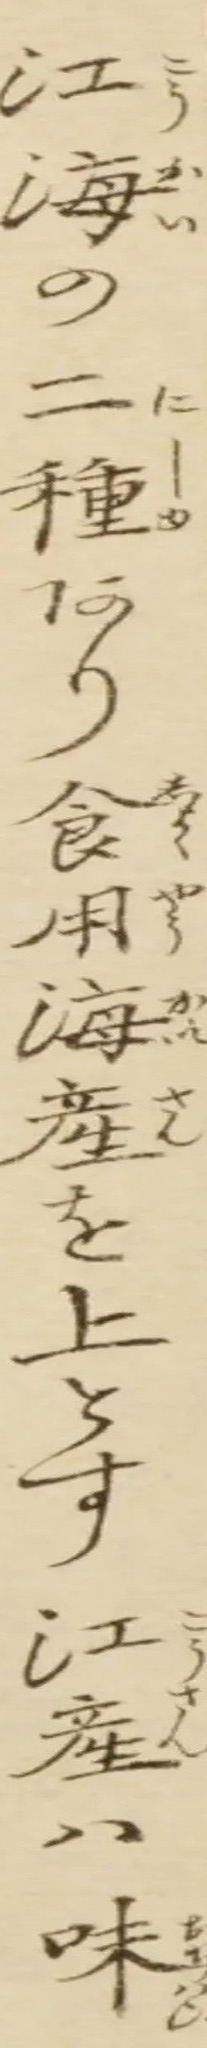江海の二種あり食用海産を上とす江産は味
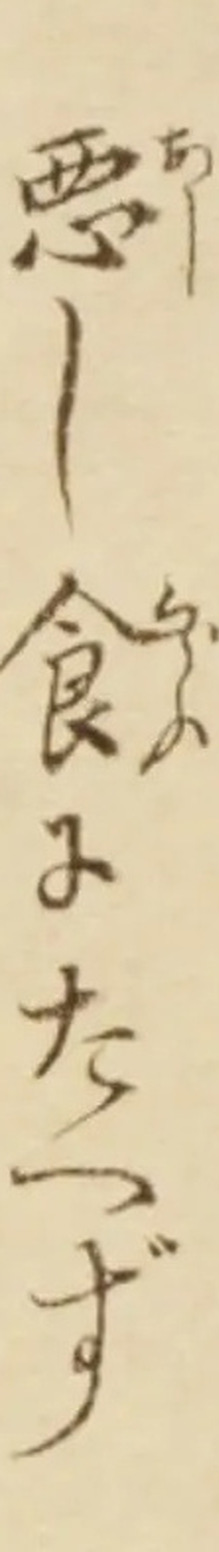悪し食にたへず
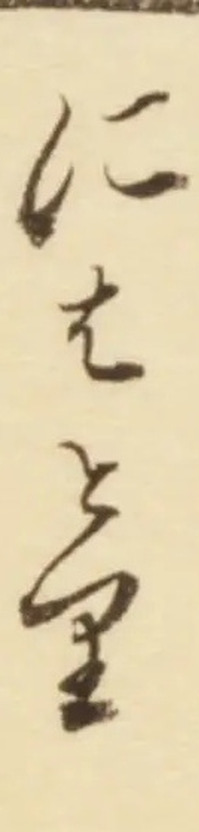にはとり

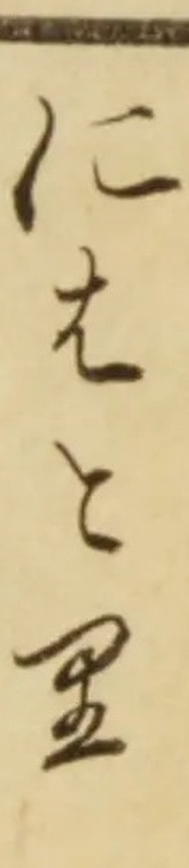にはとり
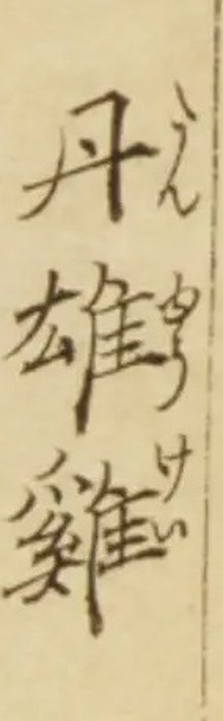丹雄鶏
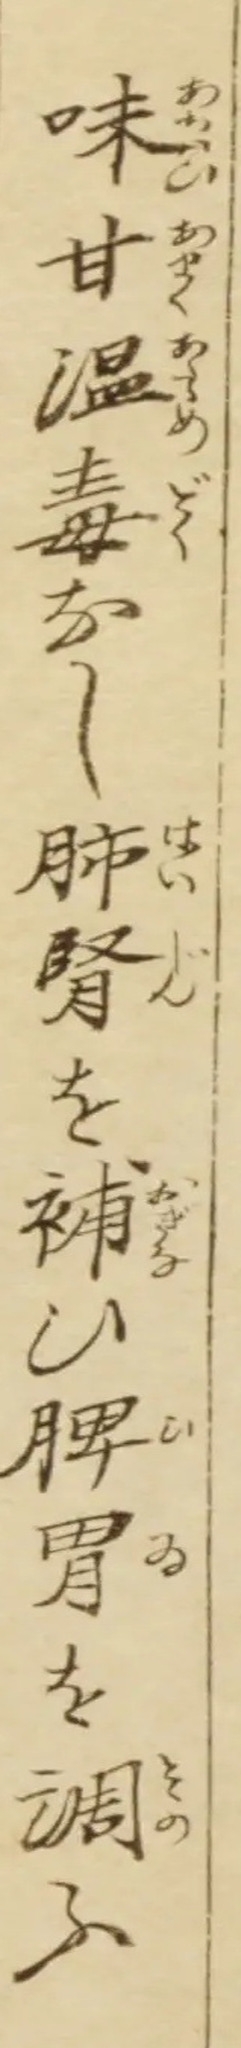味甘温毒なし肺腎を補ひ脾胃を調ふ
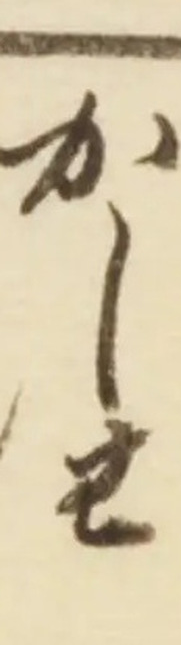かしは
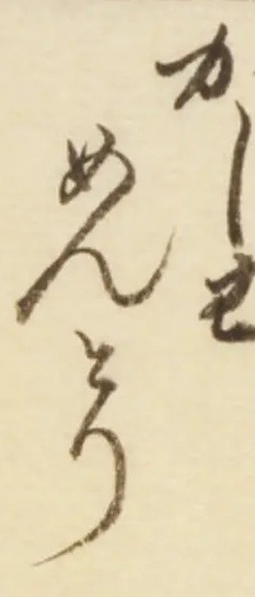めんとり
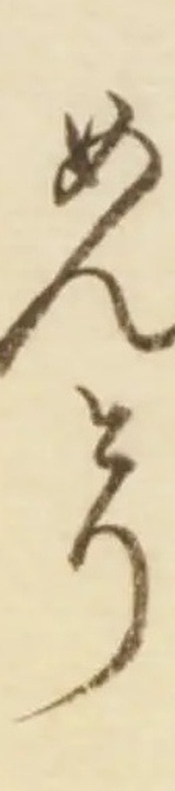めんとり

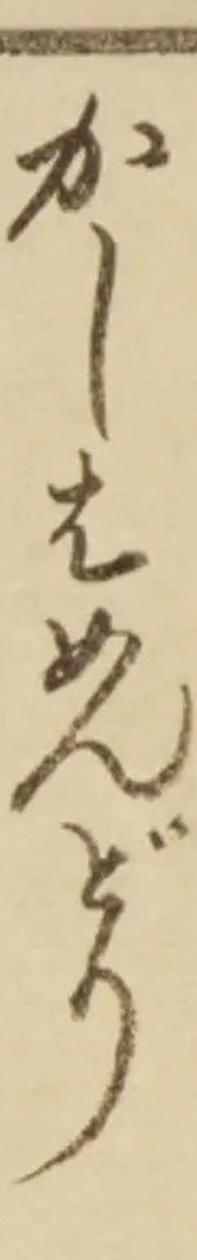かしはめんどり
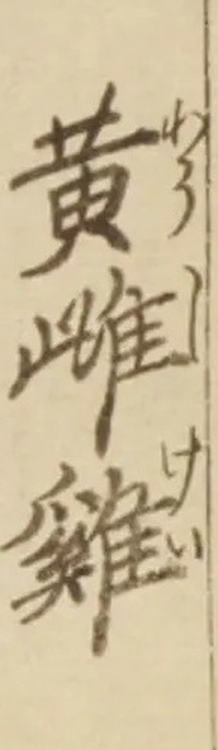黄雌鶏
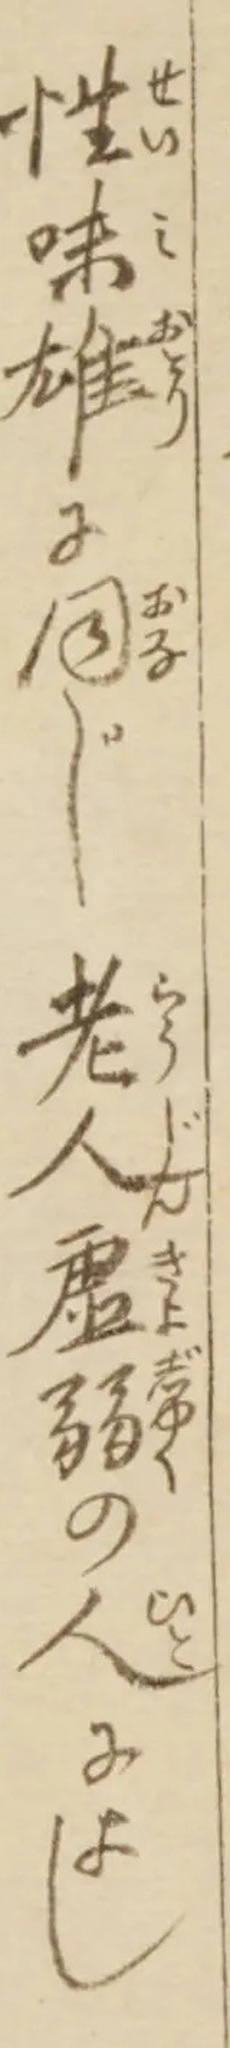性味雄に同じ老人虚弱の人によし
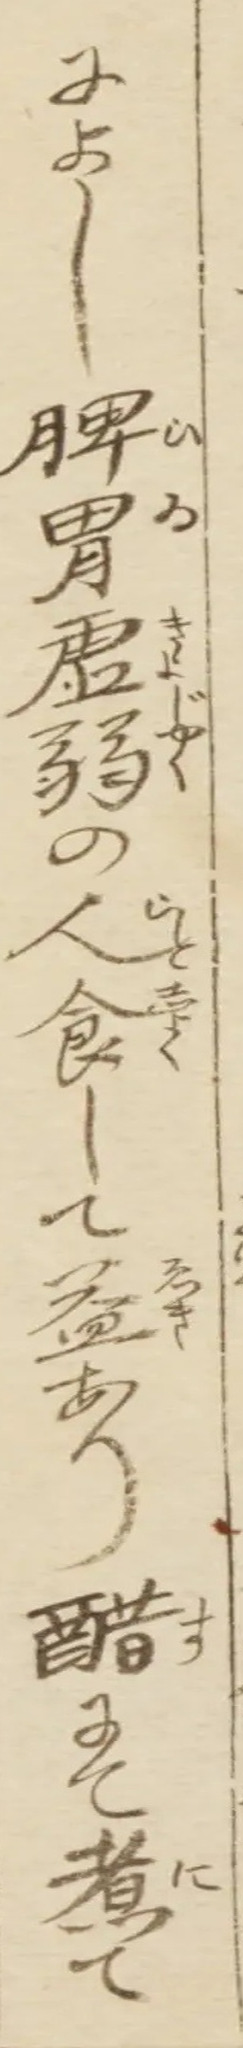によし脾胃虚弱の人食して益あり醋にて煮て
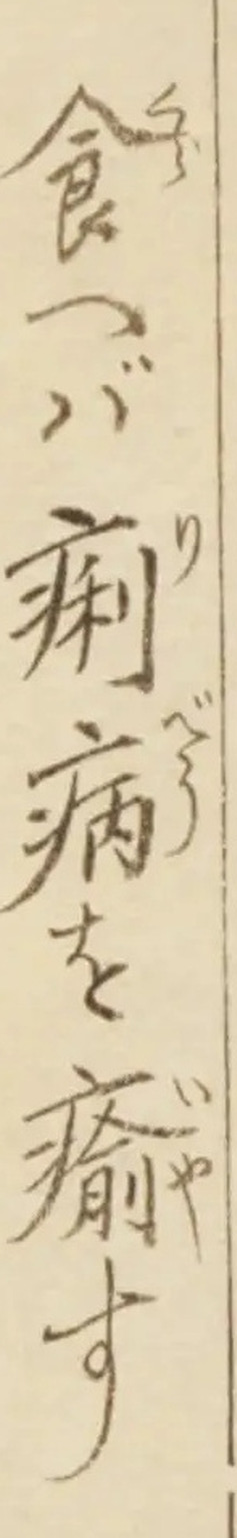食へば痢病を癒す
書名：華鳥譜
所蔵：国立国会図書館 National Diet Library, JAPAN
